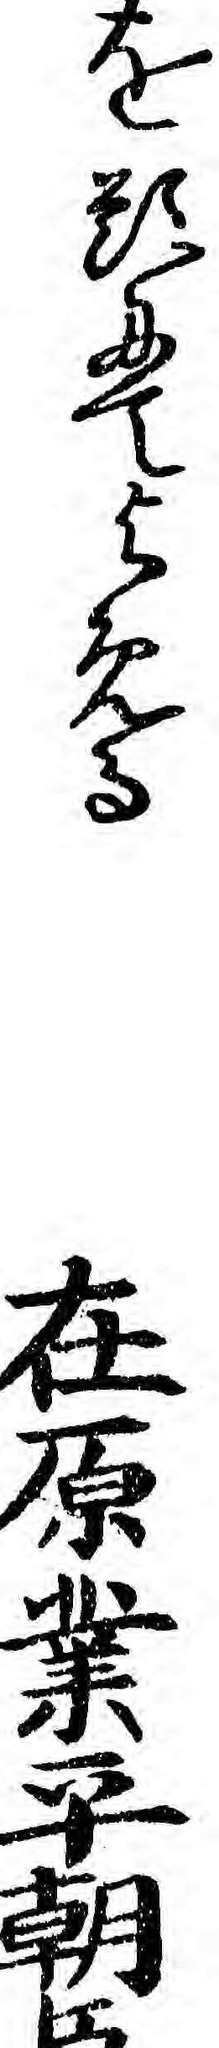を題にてよめる在原業平朝臣
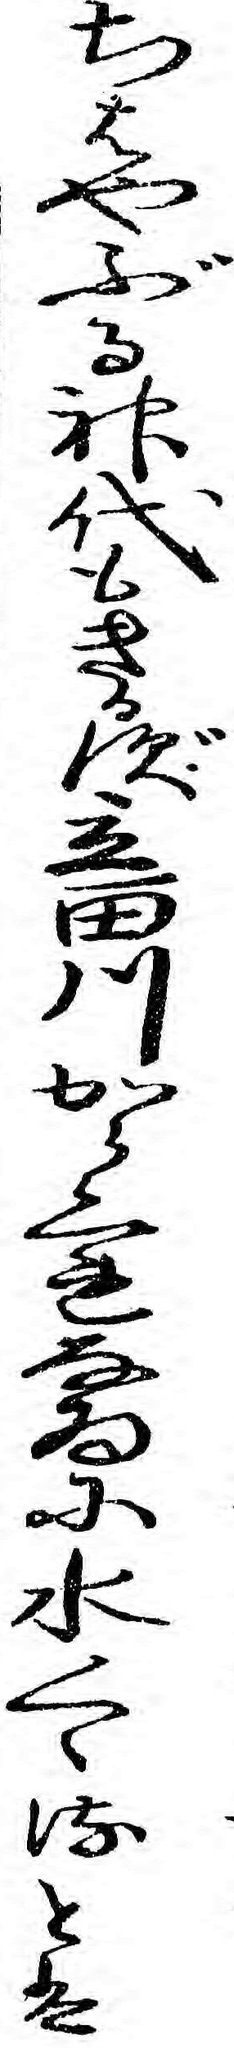ちはやぶる神代もきかず立田川からくれなゐに水くゝるとは
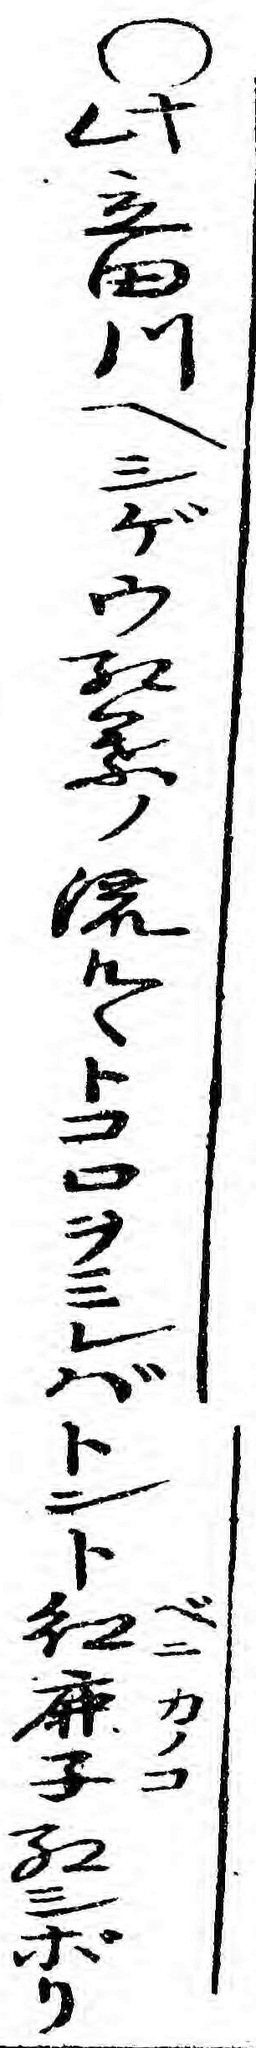○此立田川ヘシゲウ紅葉ノ流ルヽトコロヲミレバトント紅鹿子紅シボリ
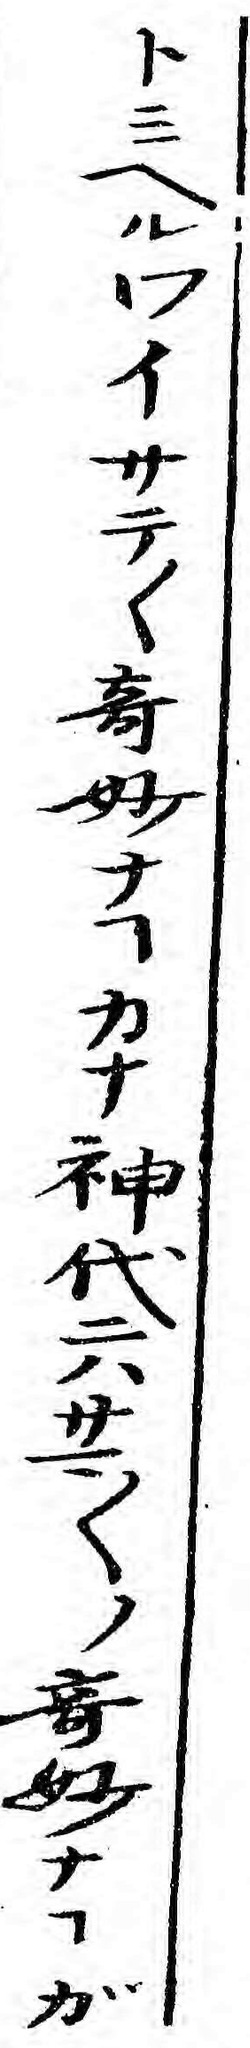トミヘルワイサテ〳〵奇妙ナコトカナ神代ニハサマ〳〵ノ奇妙ナコトガ
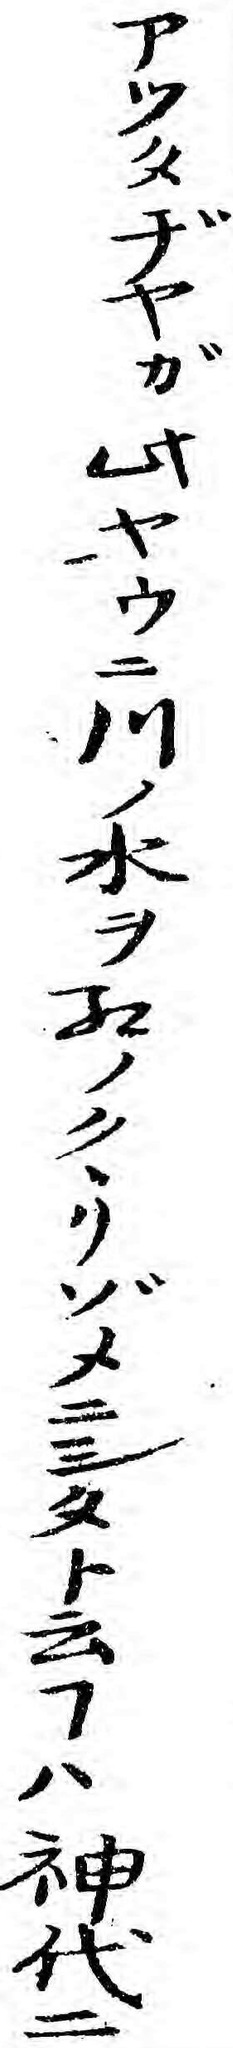アツタヂヤガ此ヤウニ川ノ水ヲ紅ノクヽリゾメニシタト云コトハ神代ニ
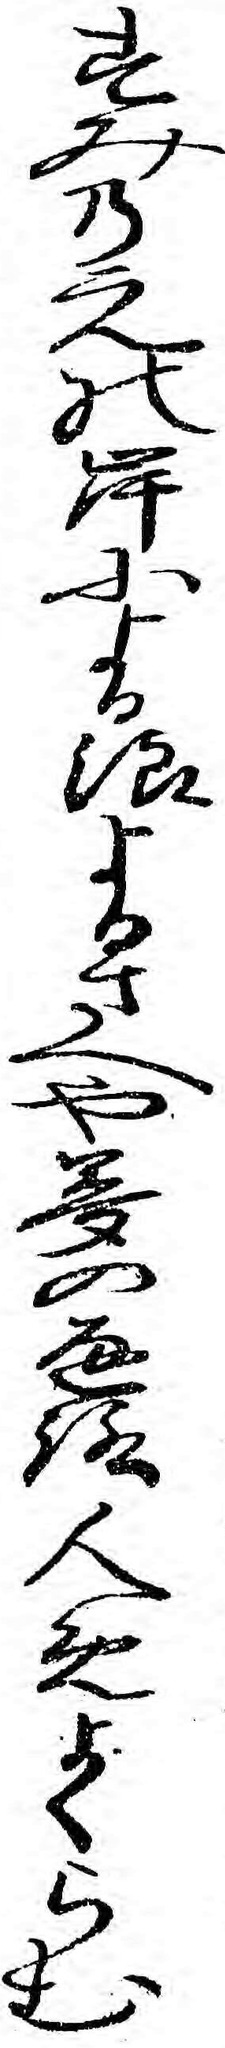すみのえの岸による浪よるさへや夢の通路人めよくらむ

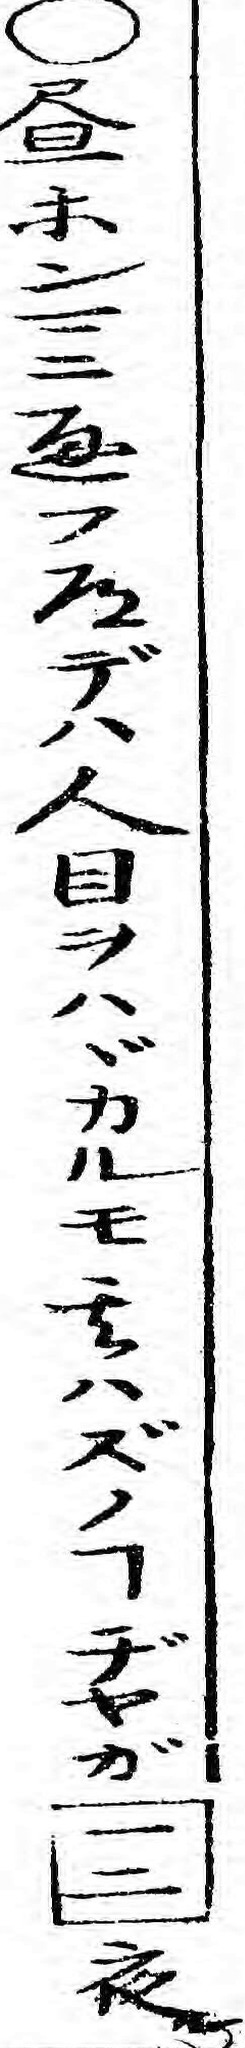○昼ホンマニ通フ道デハ人目ヲハヾカルモ其ハズノコトヂヤガ一二夜
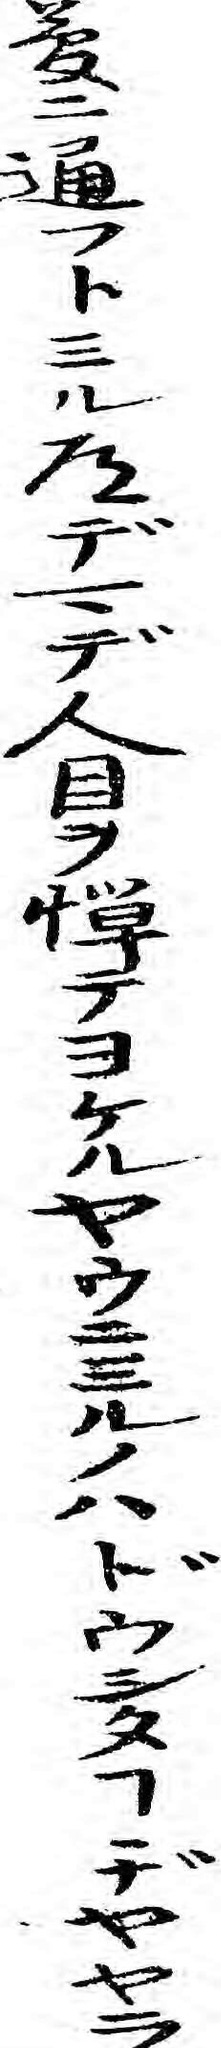夢ニ通フトミル道デマデ人目ヲ憚テヨケルヤウニミルノハドウシタコトヂヤヤラ
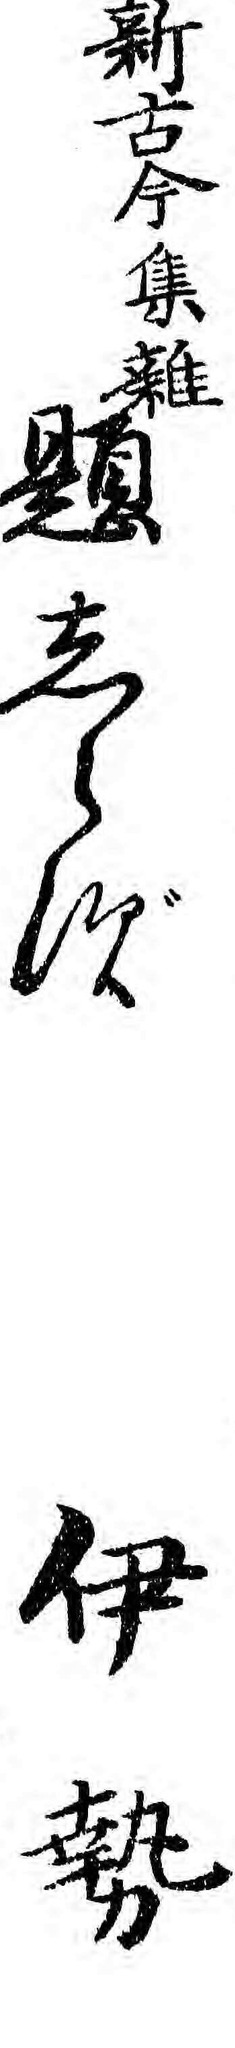新古今集雑題しらず伊勢
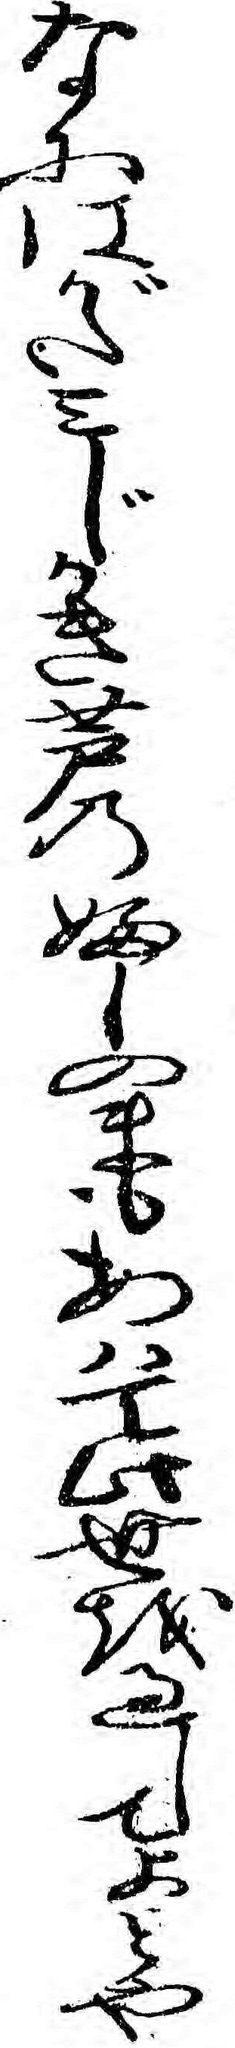なにはがたみじかき芦のふしのまもあはて此世を過してよとや
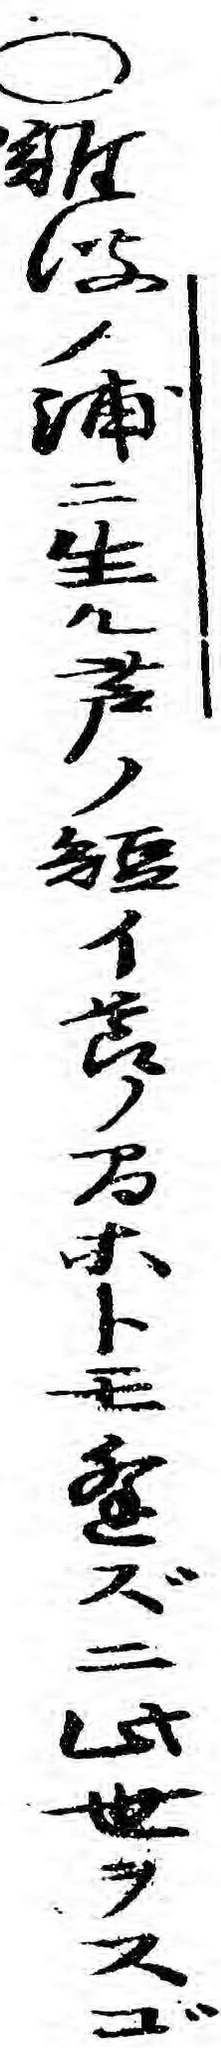○難波ノ浦ニ生ル芦ノ短イ節ノ間ホトモ逢ズニ此世ヲスゴ
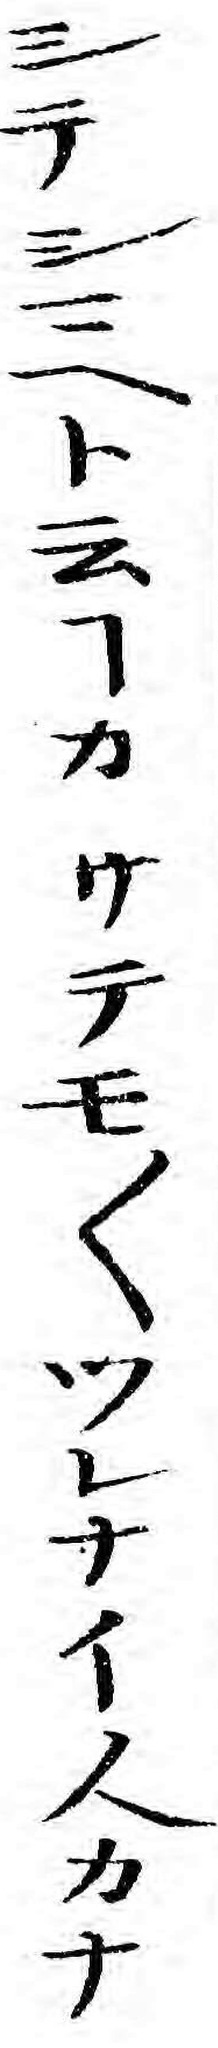シテシマヘト云コトカサテモ〳〵ツレナイ人カナ
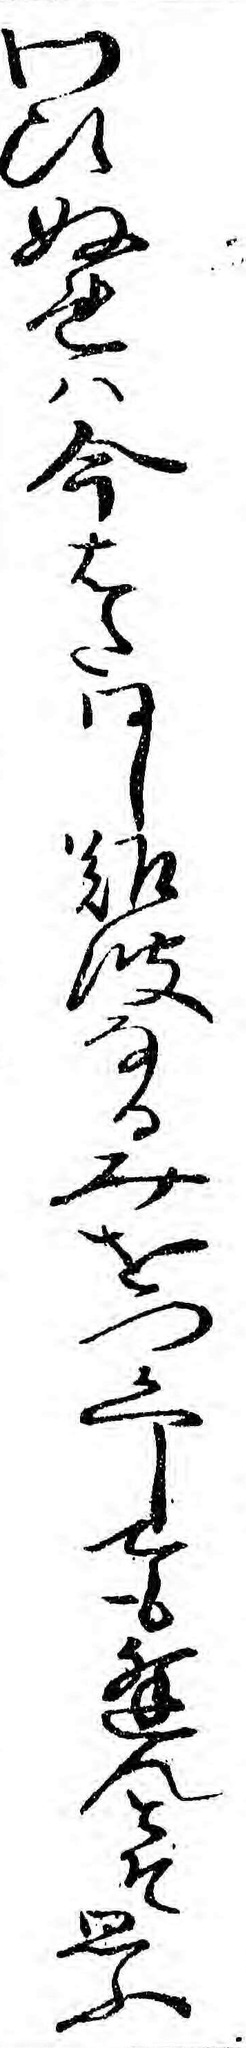わひぬれは今はた同し難波なるみをつくしても逢むとそ思ふ
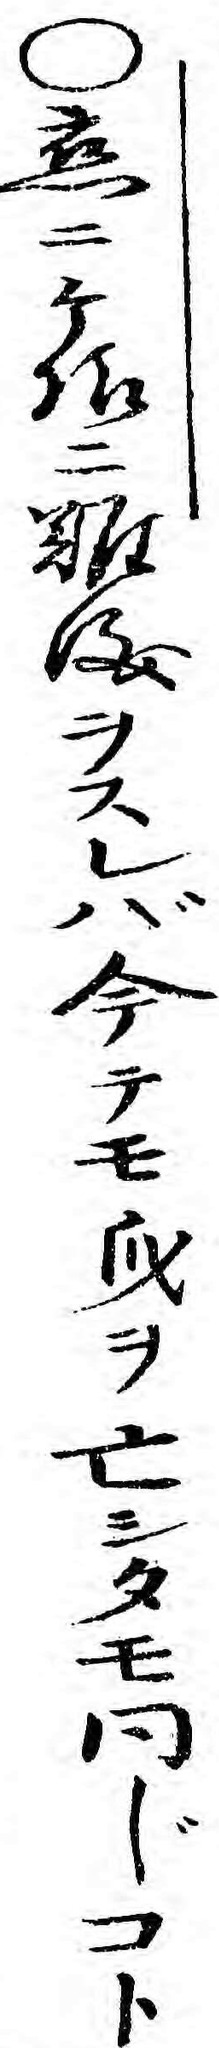○恋ニけさニ難成ヲスレバ今テモ身ヲ亡シタモ同じコト
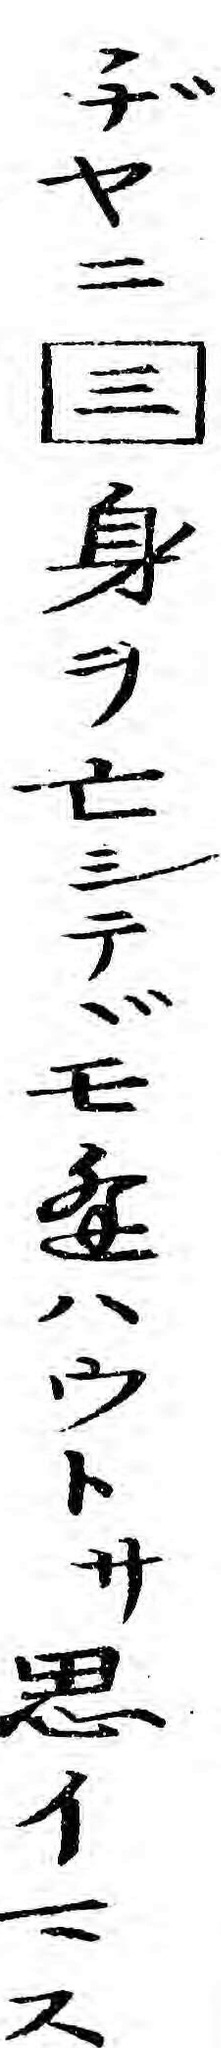ヂヤニ三身ヲ亡シテヾモ逢ハウト思イマス
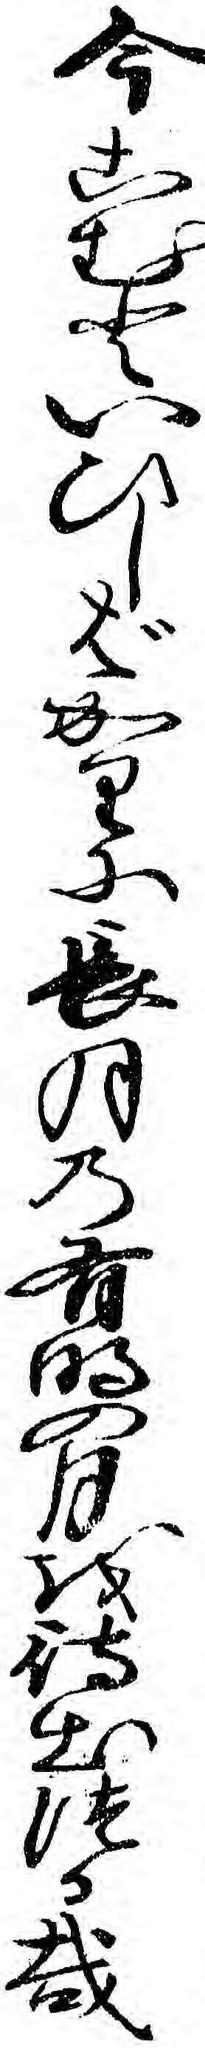今こむといひしばかりに長月の有明の月を待出つる哉
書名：百人一首／小倉の山ふみ
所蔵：国文学研究資料館
